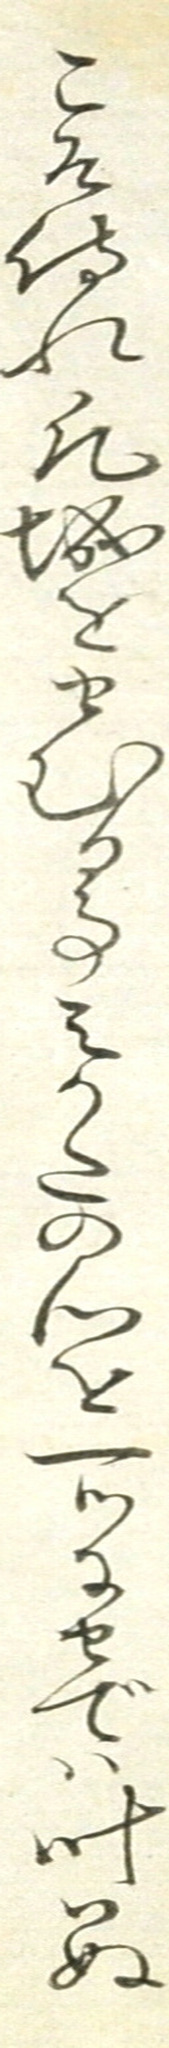こそ侍れ凡城をせむる事みかたの心を一ッにせでは叶はぬ
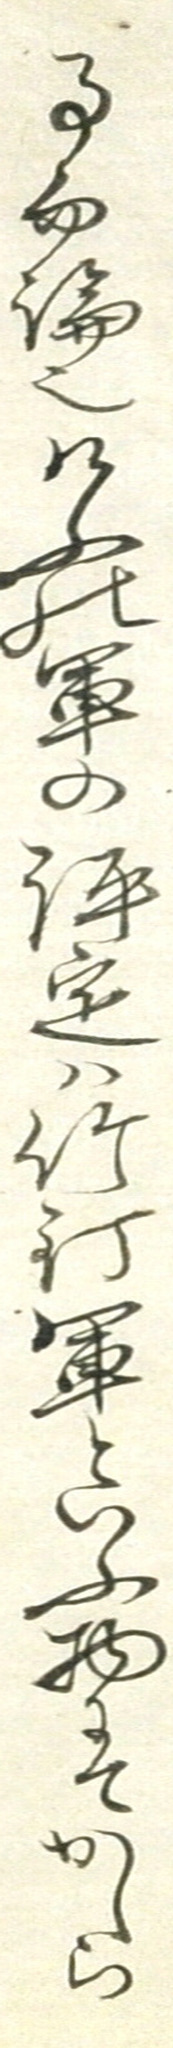事向論也けふの軍の評定は竹釘軍といふ物にてかしら
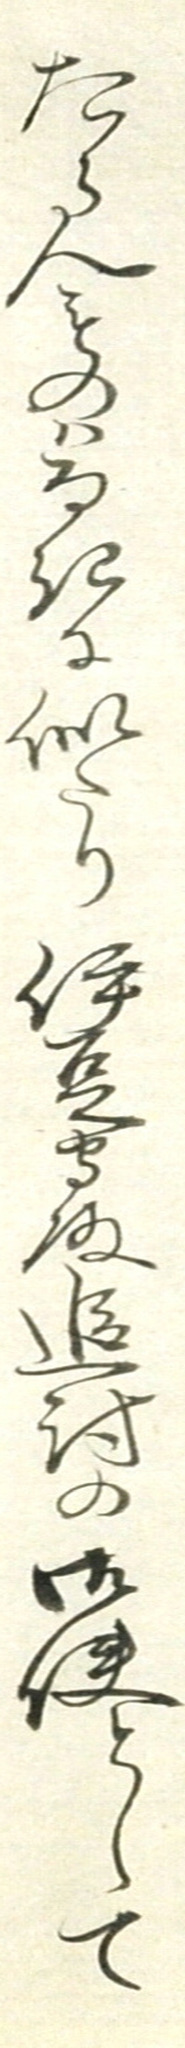たらんものはなきに似たり伊豆守殿追討の御使として
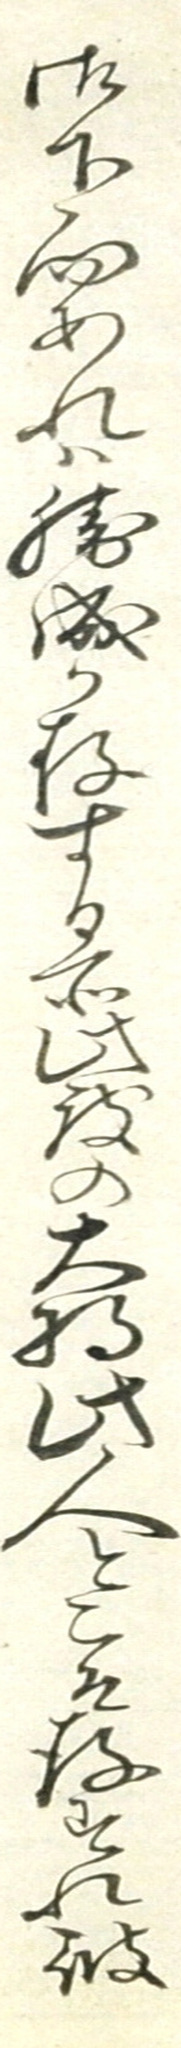御下向あれは勝成か存する所此度の大将此人とこそ存すれ彼
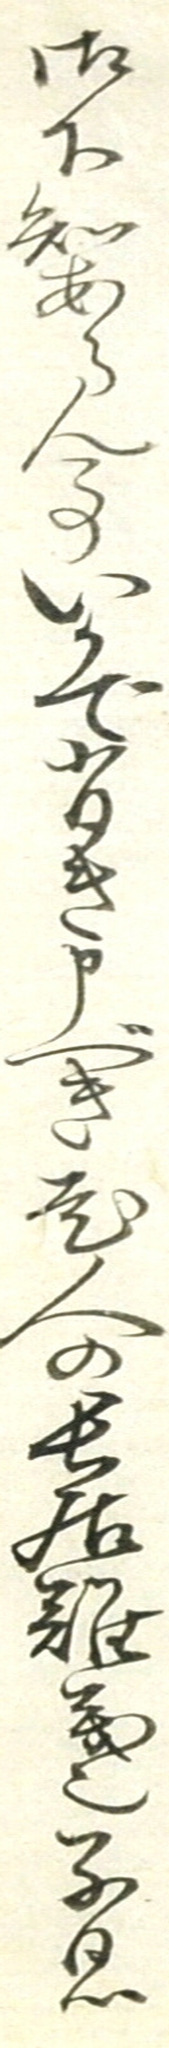御下知あらん事いかで背き申べき老人の長居難義也子息
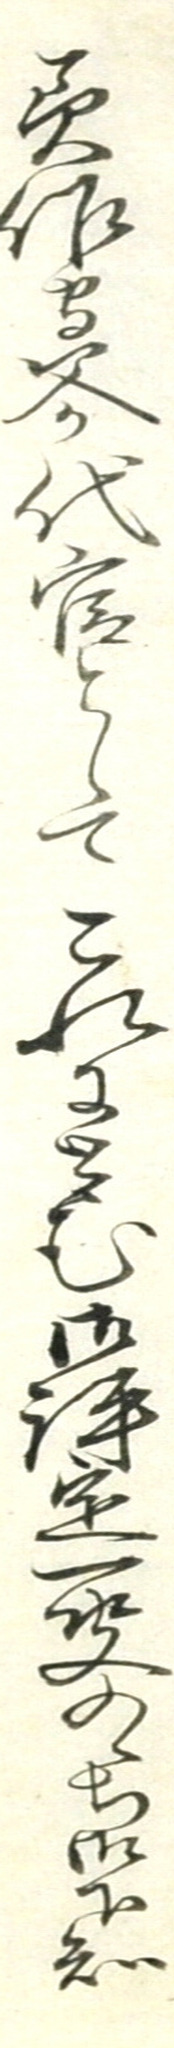美作守父か代官としてこれにとゝむ御評定一決のゝち御下知
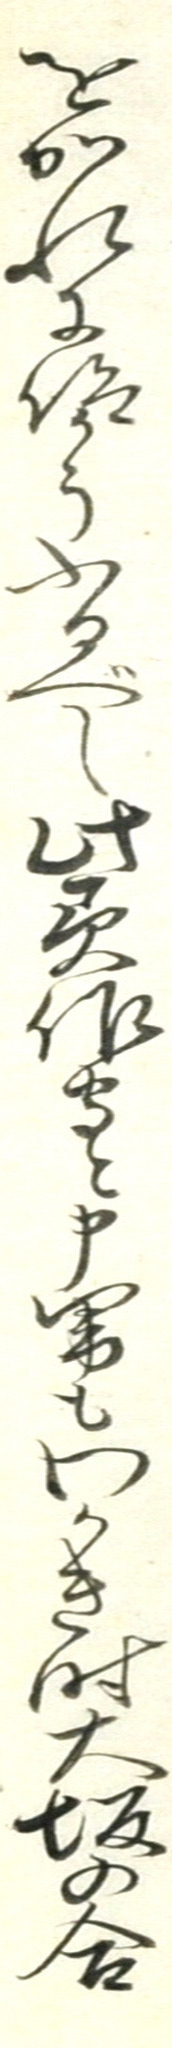をかれに仰かうふるべし此美作守と申男もわかき時大坂の合
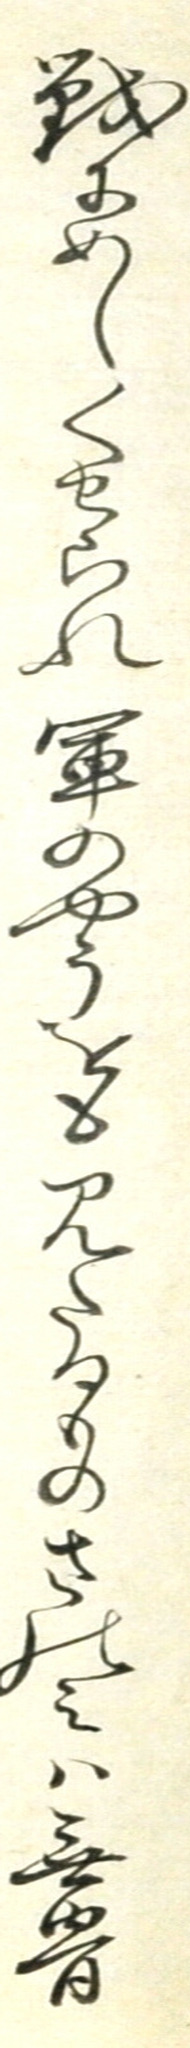戦にめしくせられ軍のやうをも見たるものさのみは無骨
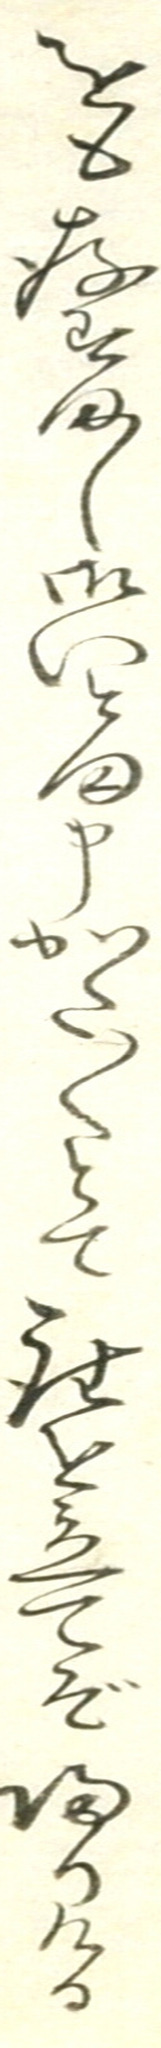をも存すまし御いとま申かた〳〵とて座を立てぞ帰りける
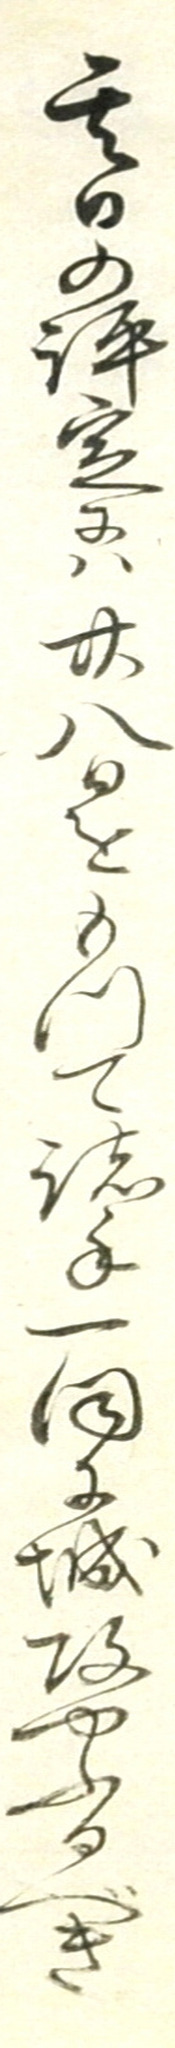其日の評定には廿八日をもつて諸手一同に城攻やふるべき
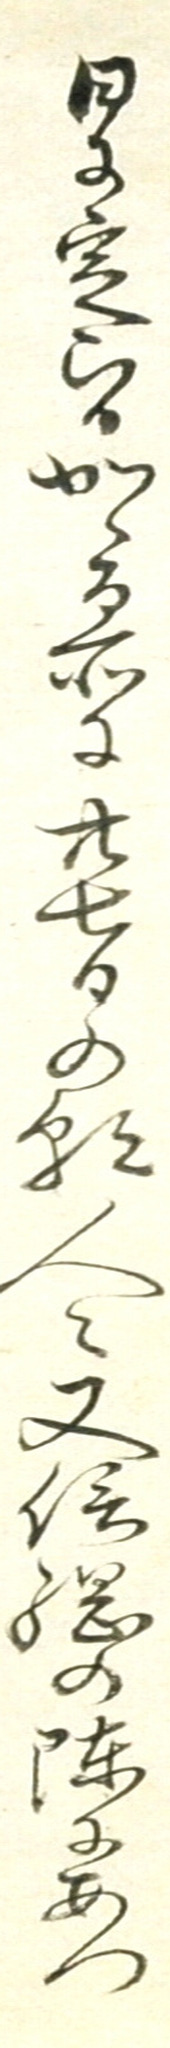日に定らるかゝる所に二十七日の朝人々又信綱の陣にあつ
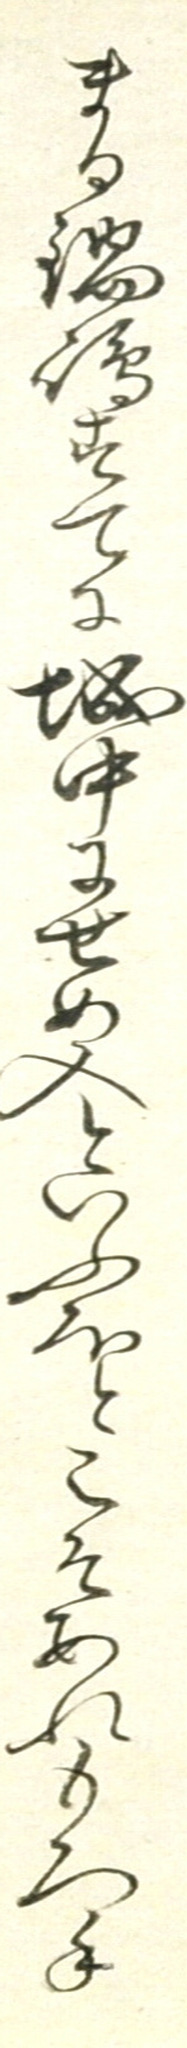まる鍋島すてに城中にせめ入といふほとこそあれもろ手
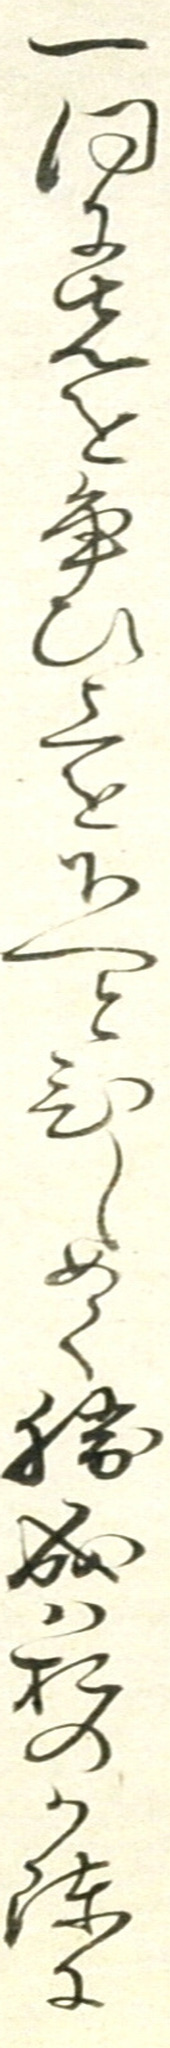一同に先を争ひ上を下へとひしめく勝成はおのか陣に
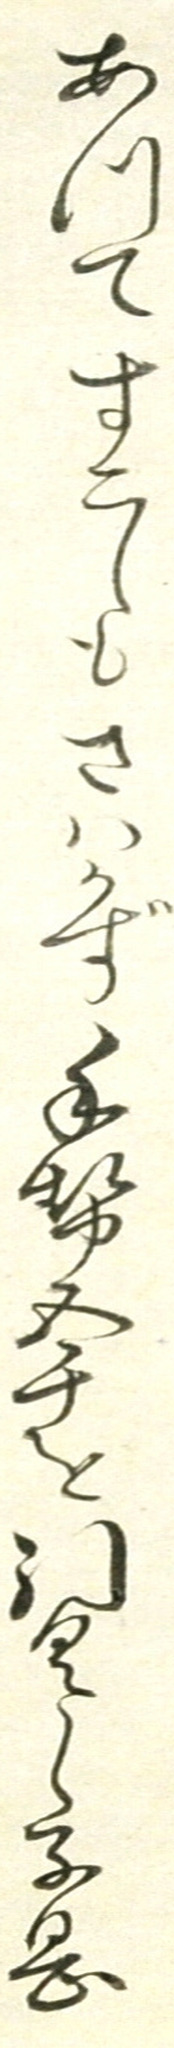あつてすこしもさはかず手勢五千を引具し子息
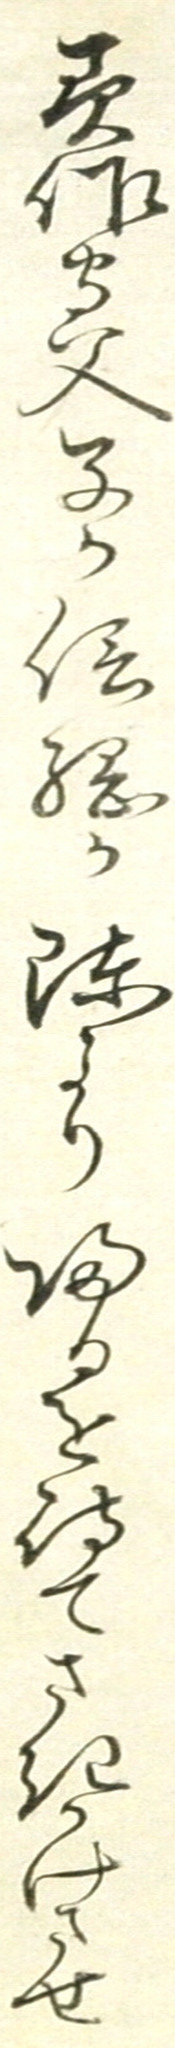美作守父子か信綱か陣より帰るを待てさきかけさせ
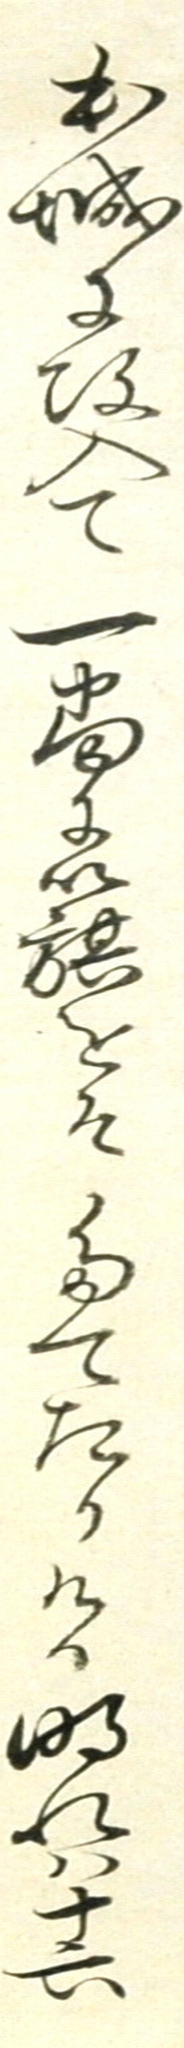本城に攻入て一番に簱をそたてたりける明れは十六
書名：藩翰譜（二・三）
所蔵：伊那市立高遠町図書館・合同会社AMANE
